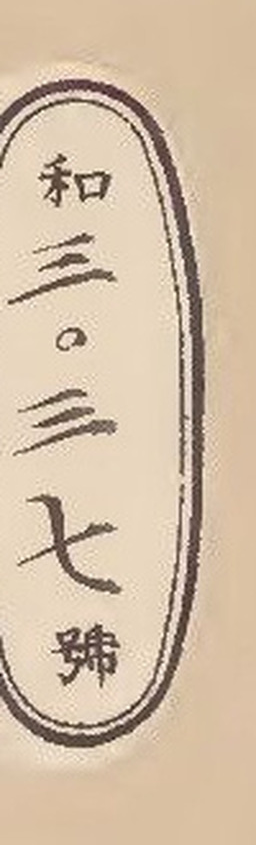和三〇三七号
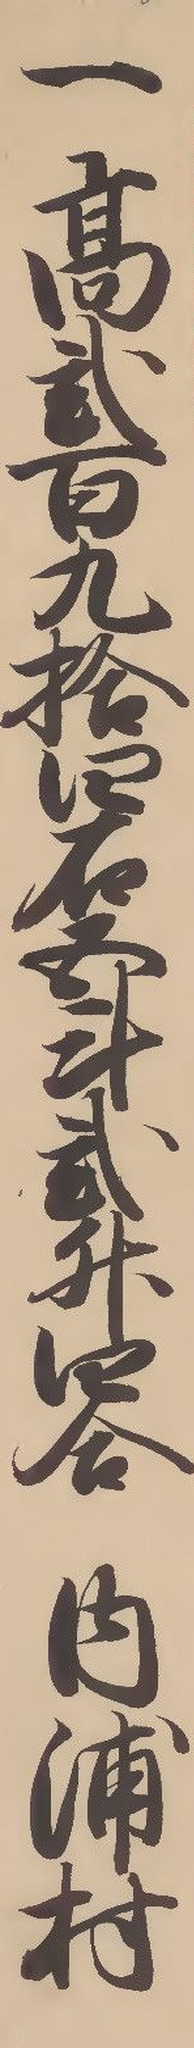一高弐百九拾四石五斗弐升四合内浦村

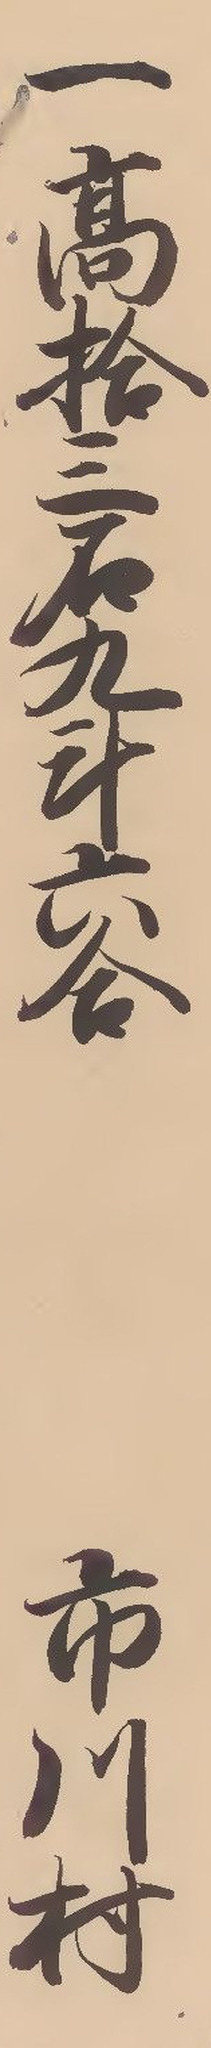一高拾三石九斗六合市川村
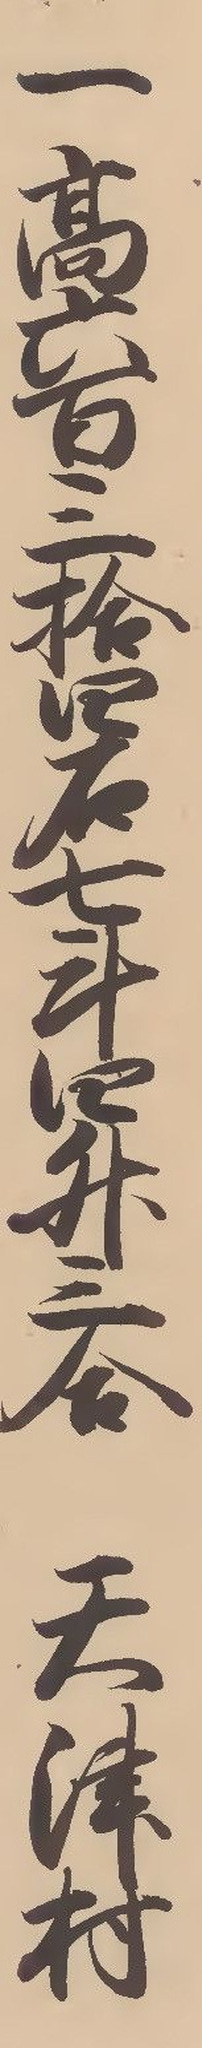一高六百三拾四石七斗四升三合天津村
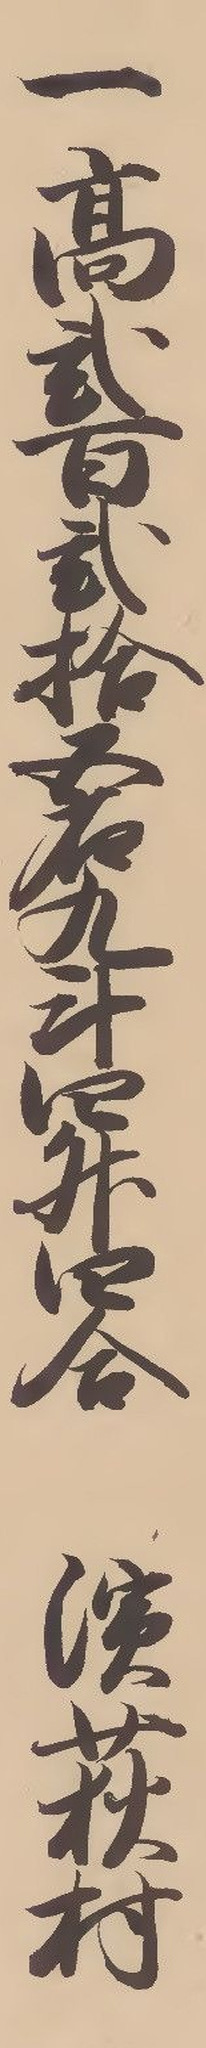一高弐百弐拾五石九斗四升四合浜荻村
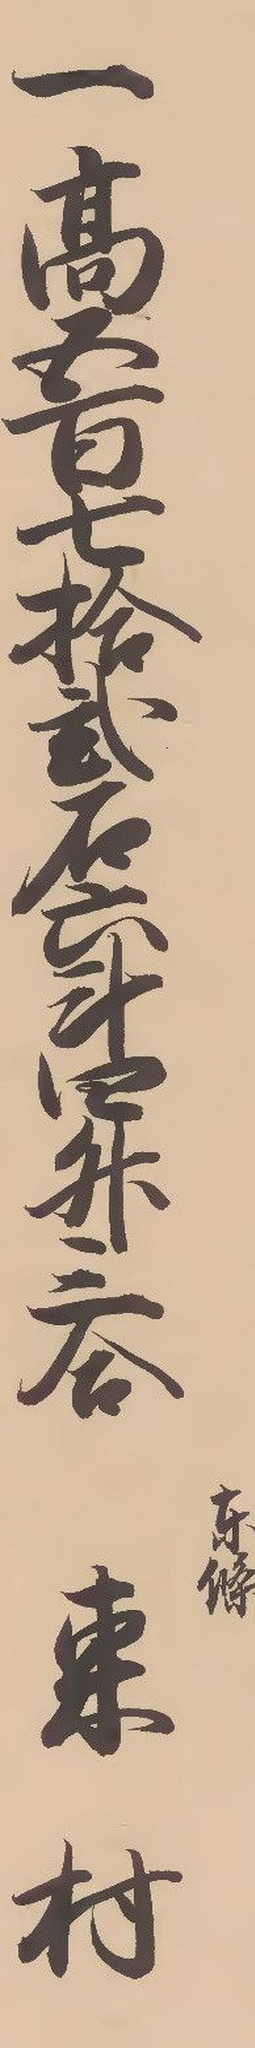一高五百七拾弐石六斗四升三合東村
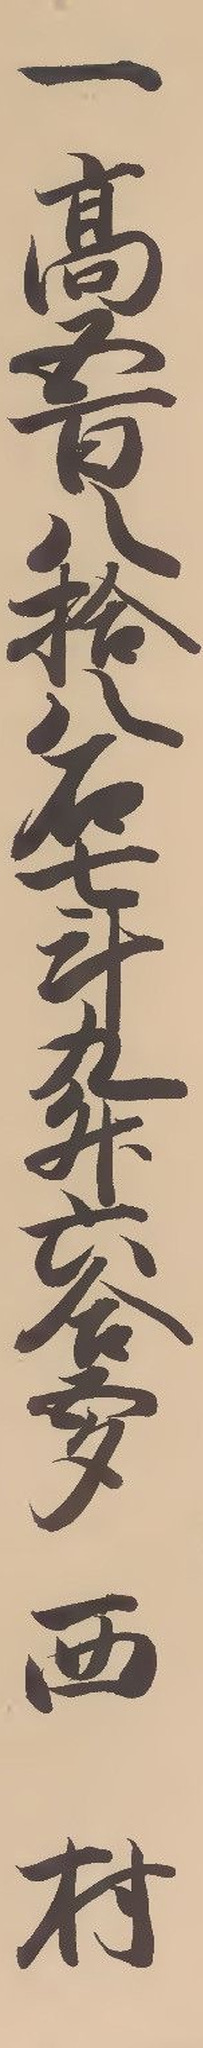一高五百八拾八石七斗九升六合五勺西村
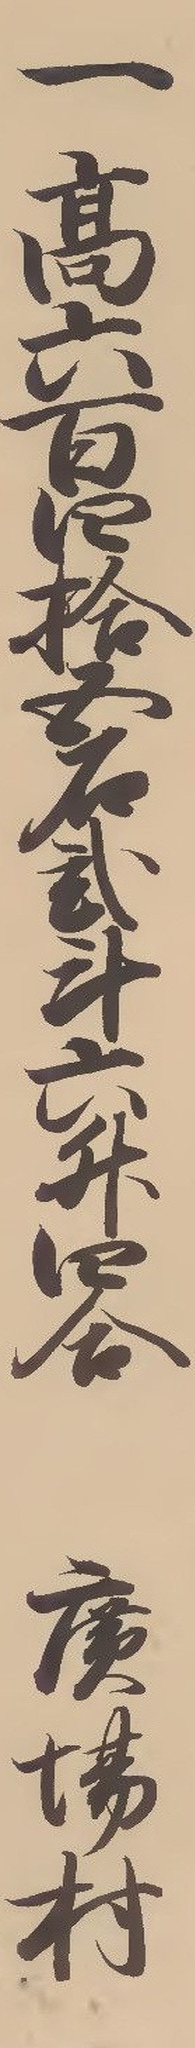一高六百四拾五石弐斗六升四合広場村
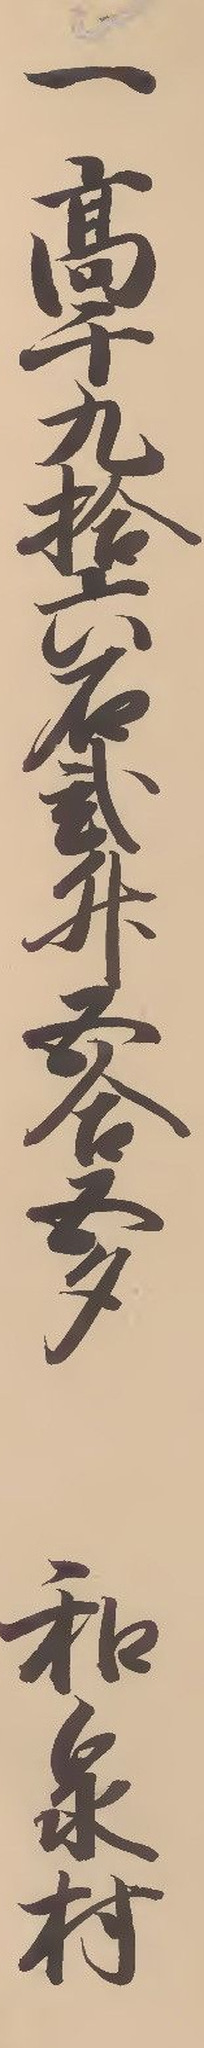一高千九拾六石弐升五合五勺和泉村
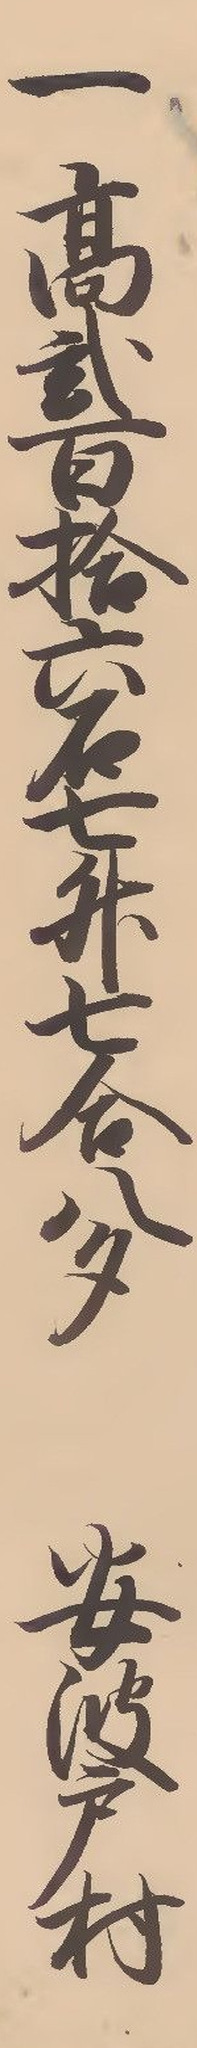一高弐百拾六石七升七合八勺安波戸村

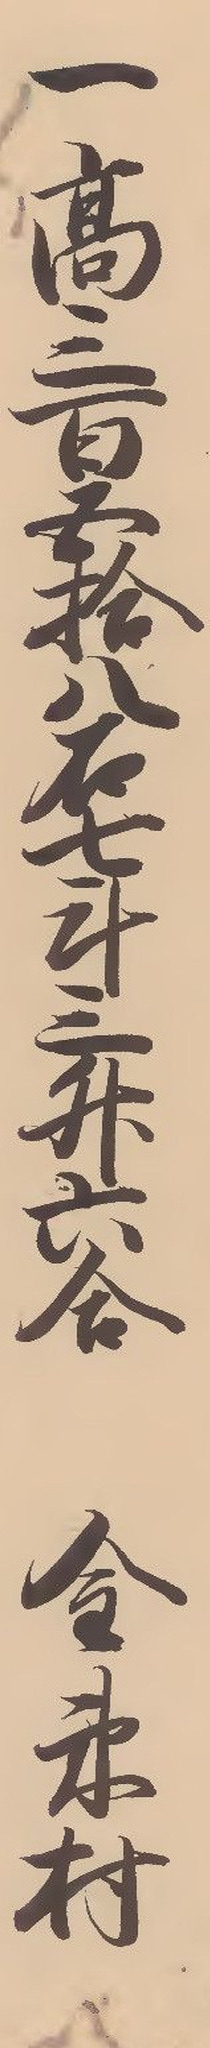一高三百五拾八石七斗三升六合金束村
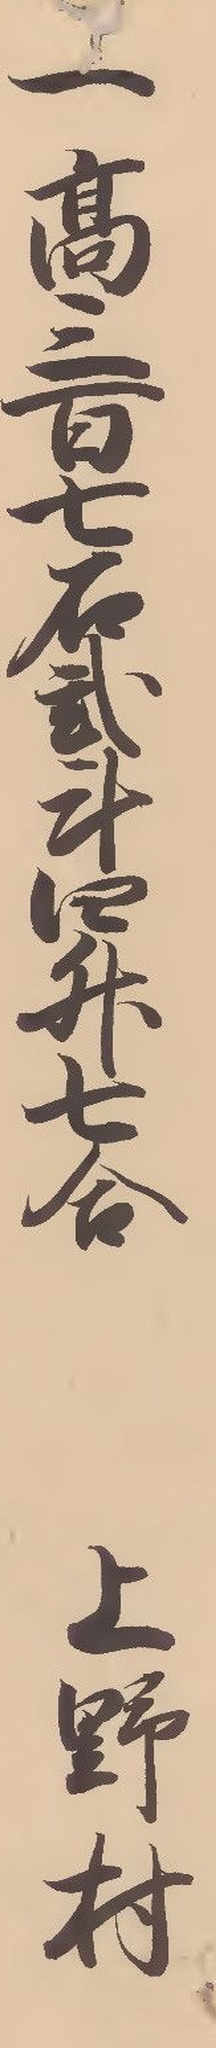一高三百七石弐斗四升七合上野村
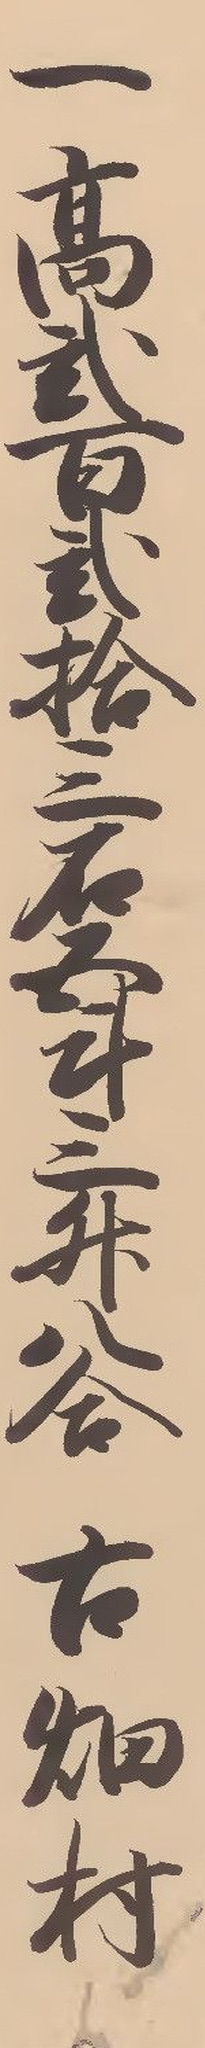一高弐百弐拾三石五斗三升八合古畑村
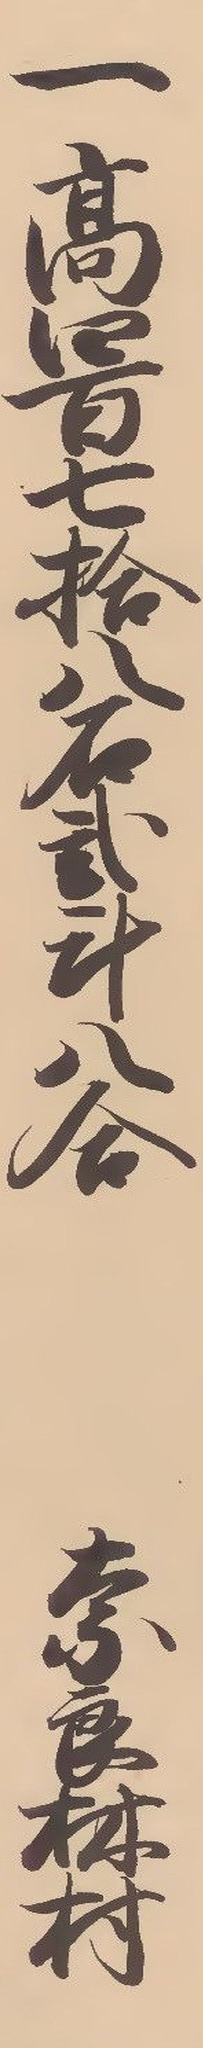一高四百七拾八石弐斗八合奈良林村
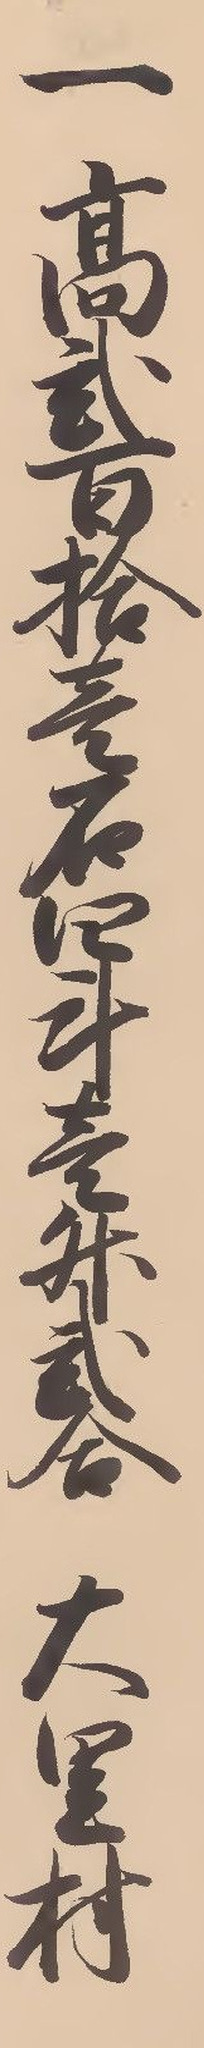一高弐百拾壱石四斗壱升弐合大里村
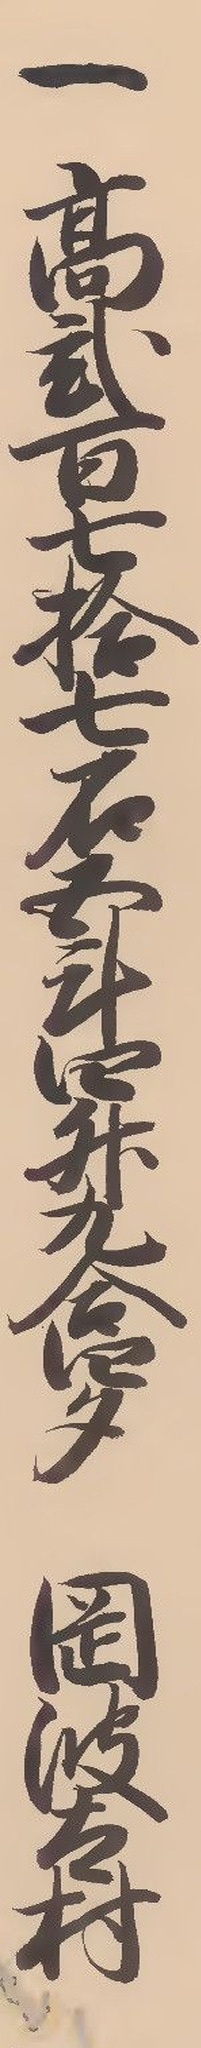一高弐百七拾七石五斗四升九合四勺岡波太村
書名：安房国郷帳
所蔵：国立公文書館 National Archives of Japan
